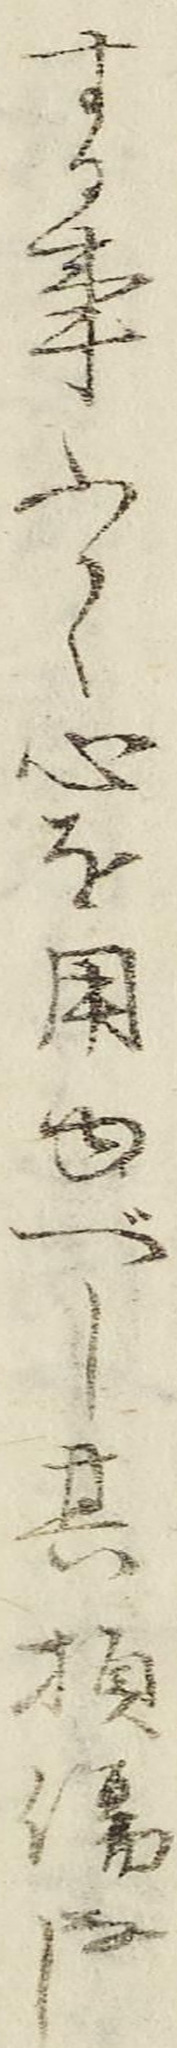する事ふかく心を用ゆべし其損傷なし
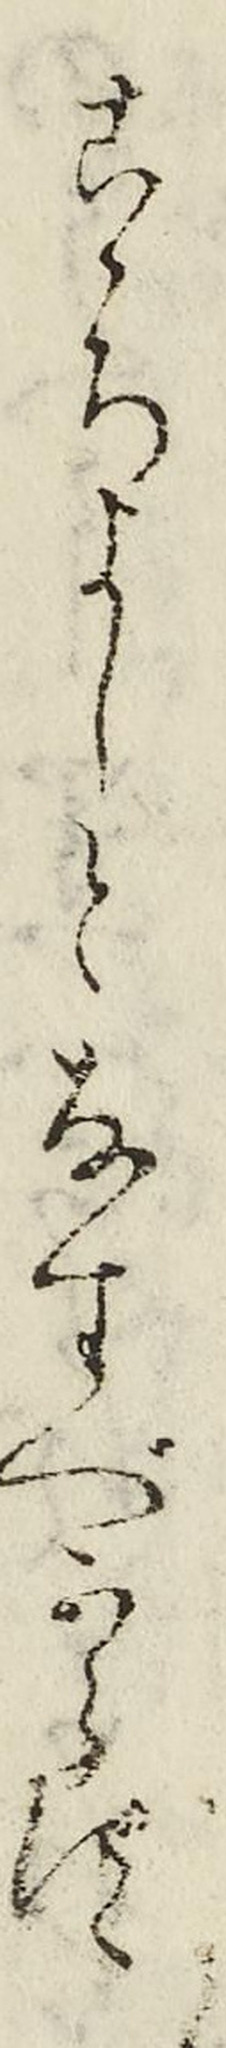こころよしとなすべからず

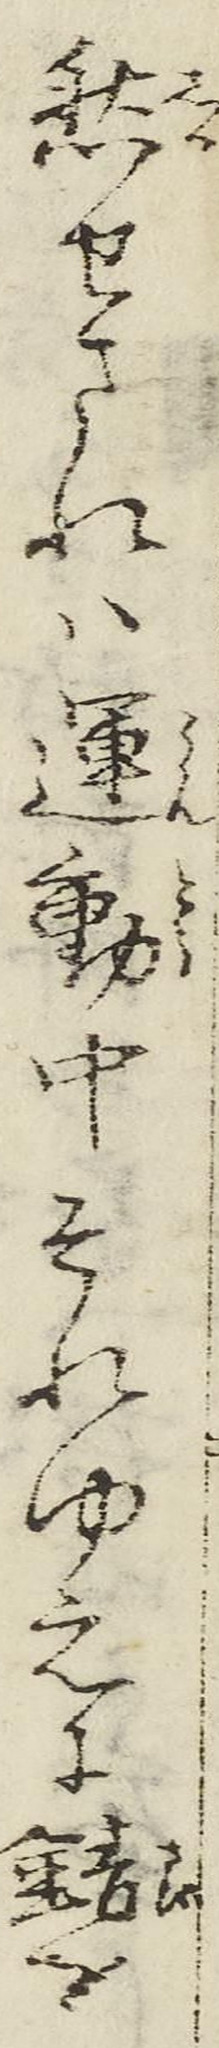然せされは運動中それゆえに錆を
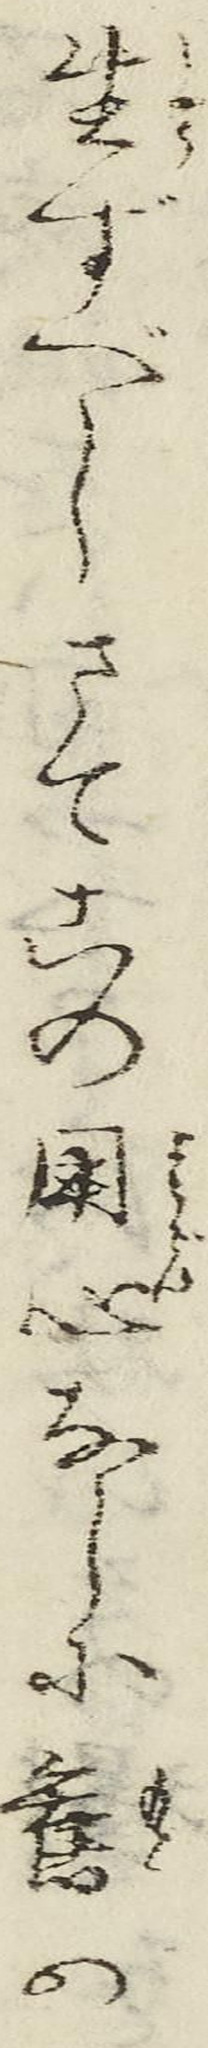生ずべしさてこの用心なしに旧の
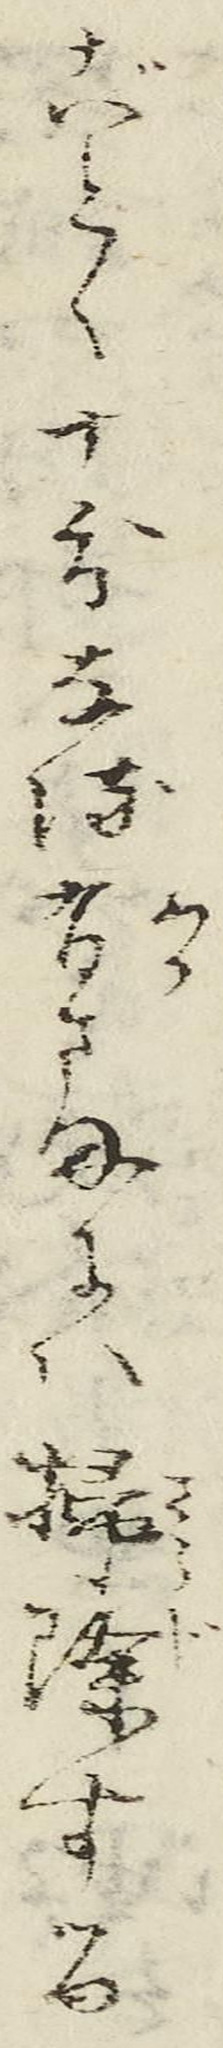ごとく十分なる有さまには掃除する
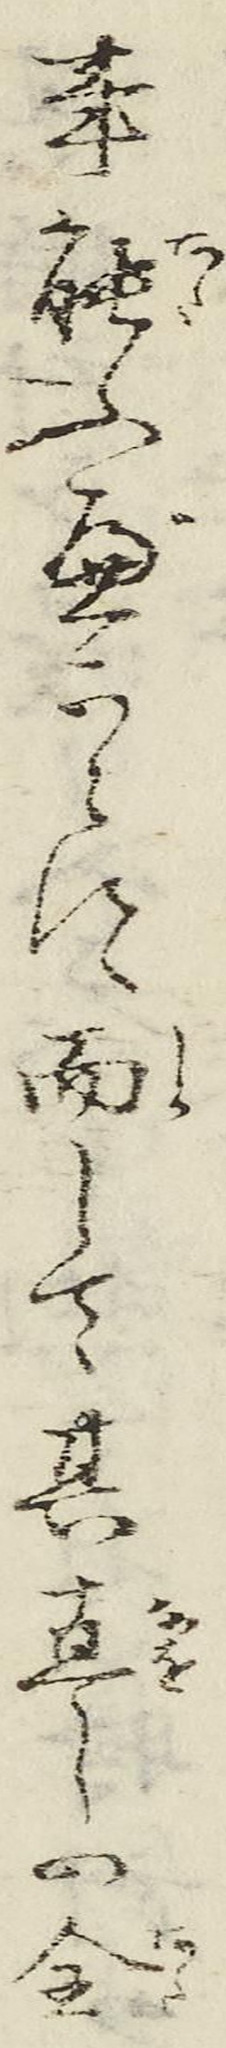事能ふべからす而して其直しの全
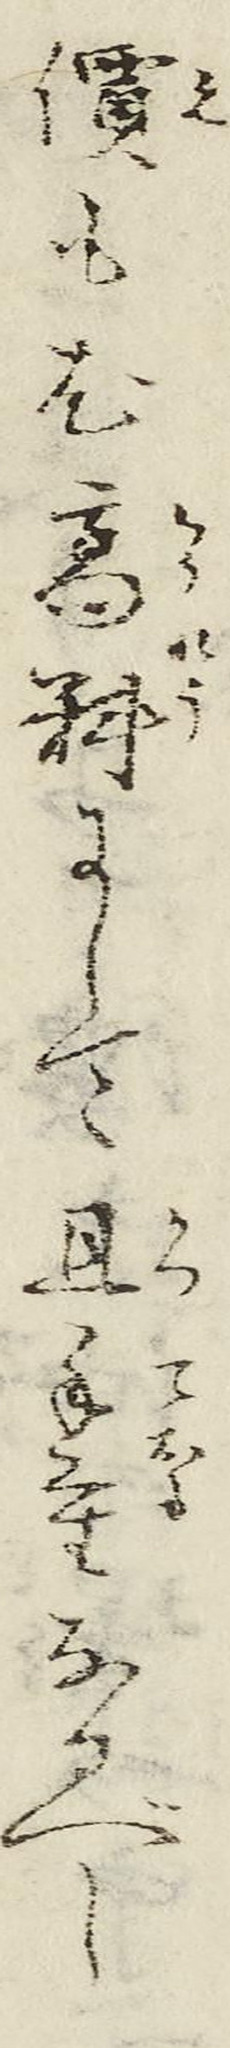価も尤高料にして且手重なるべし
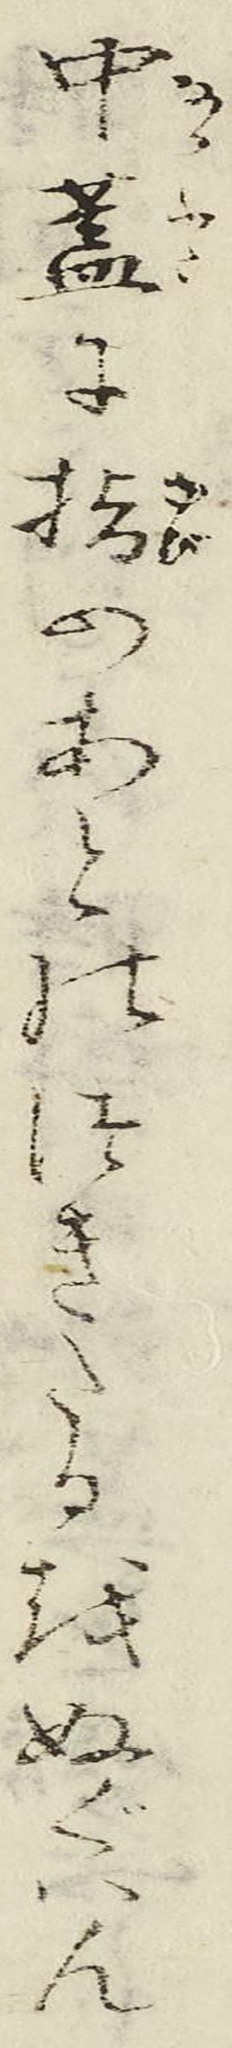中蓋に指のあとのつきたるをぬぐはん
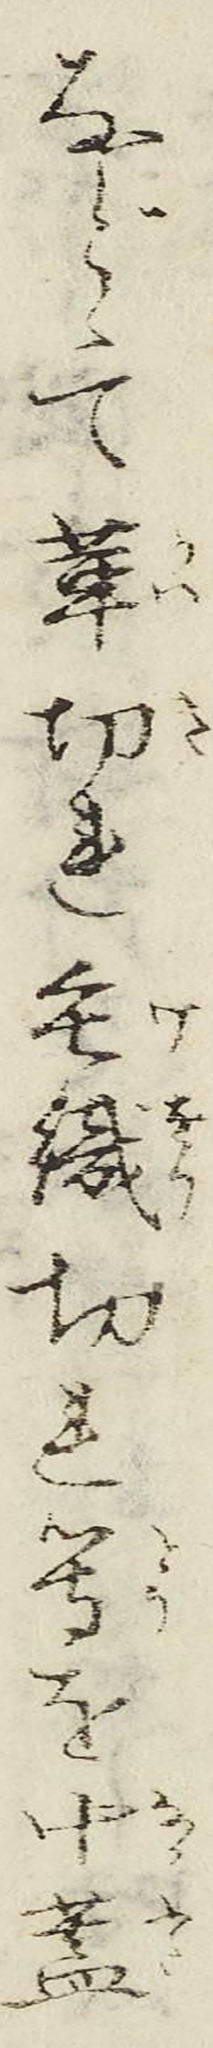などゝて革切れ毛織切れ等を中蓋
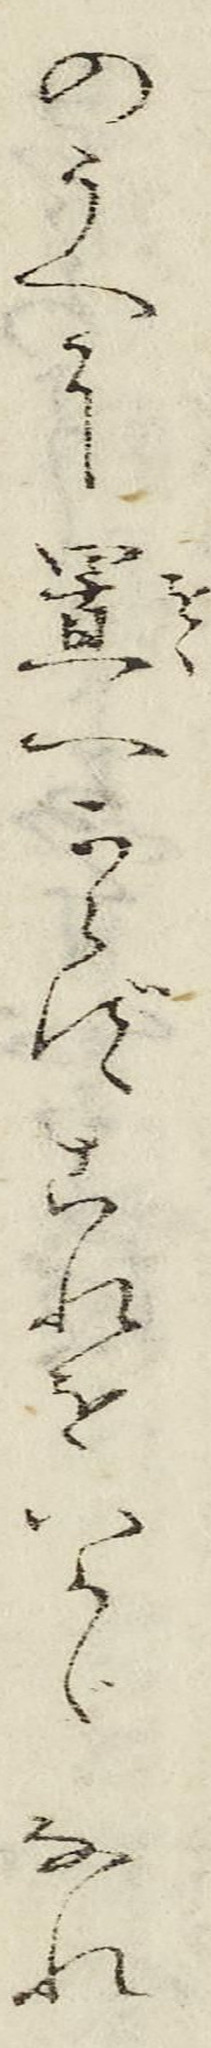のうへに置へからずこれをいかゞなれ
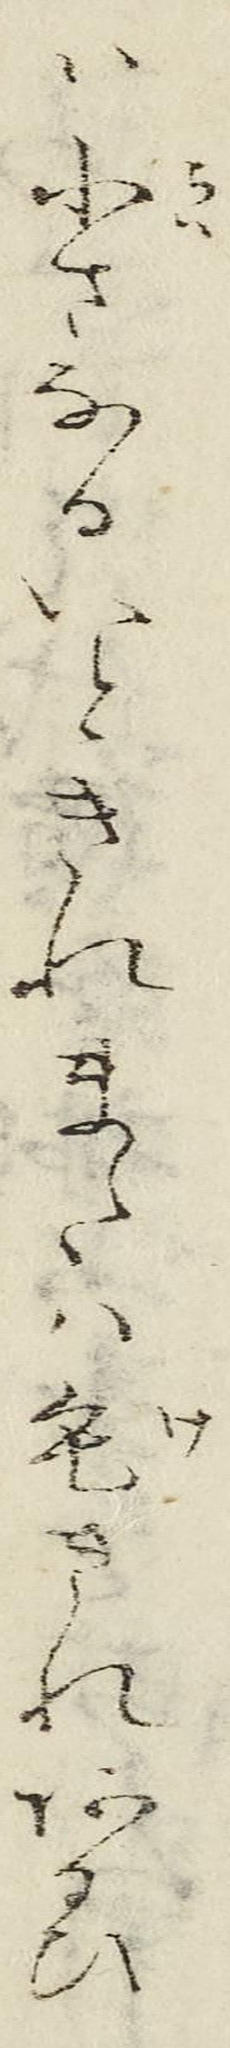は小さなるいときれまたは毛きれあるひ
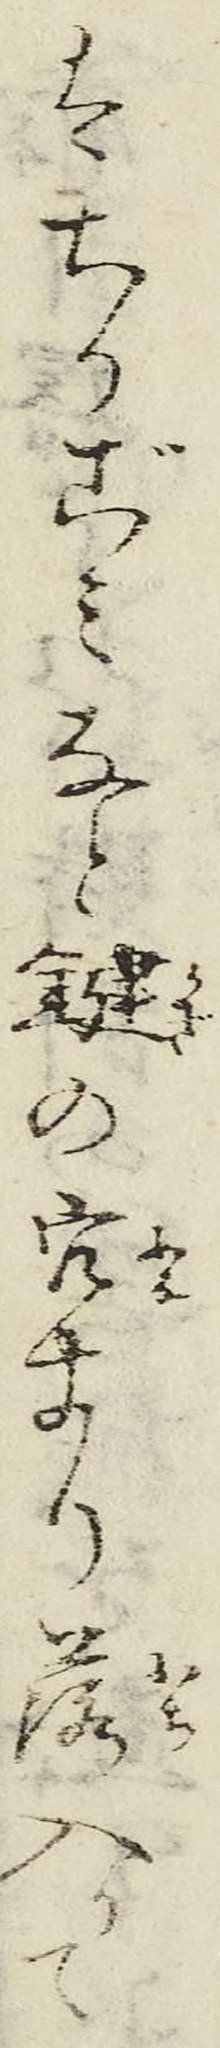はちりごみなと鍵の穴より落入りて
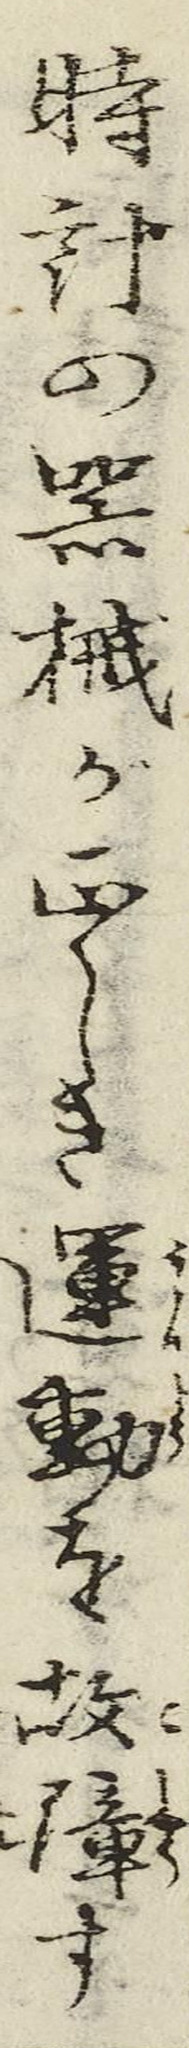時計の器械が正しき運動を故障す
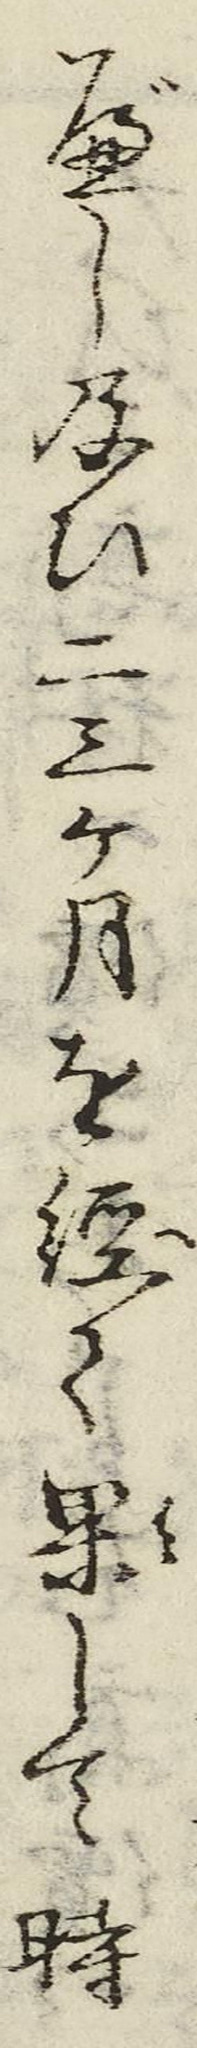べし及ひ二三ヶ月を経て果して時
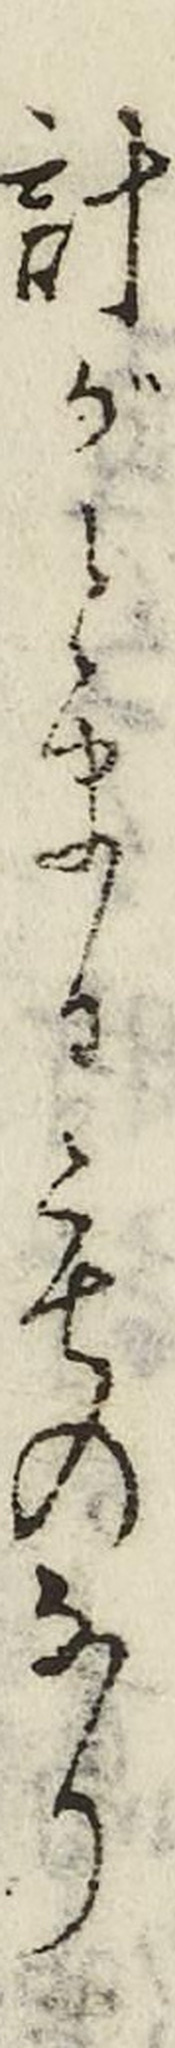計がとまるものなり
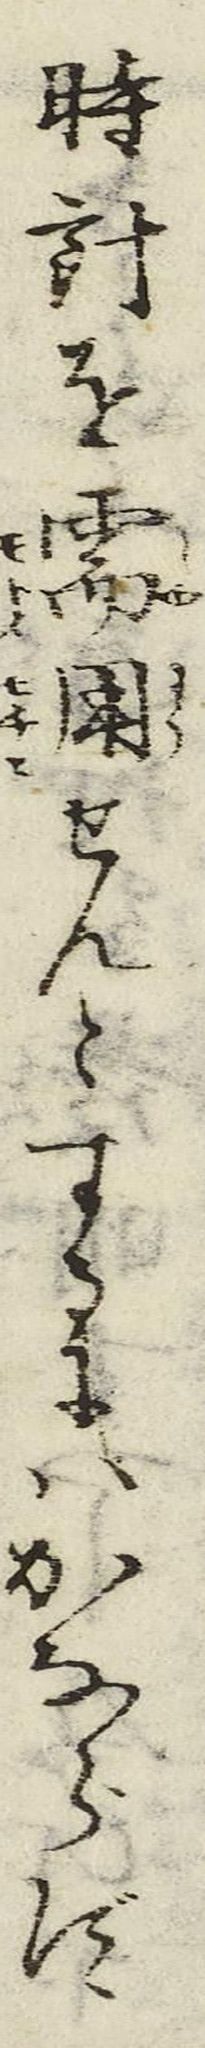時計を需用せんとするにはかならず
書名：[時計に関する冊子]
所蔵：東京大学地震研究所図書室 Earthquake Research Institute Library, The University of Tokyo, JAPAN
